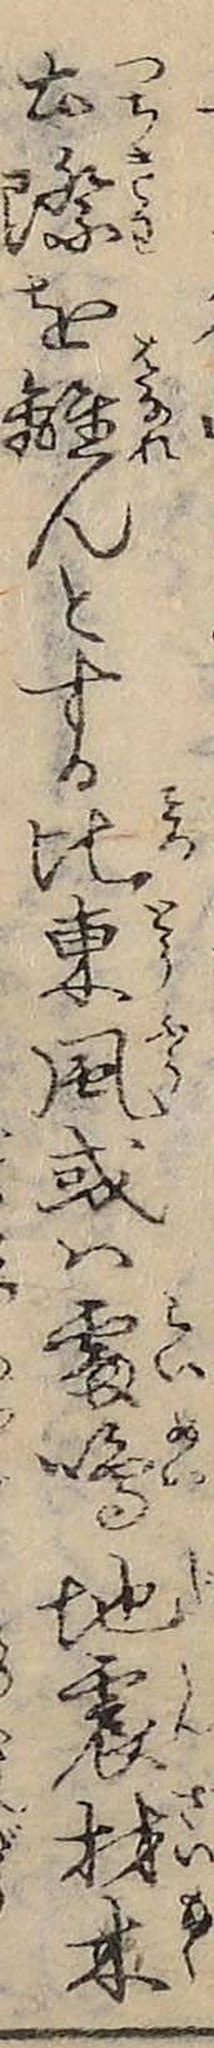土際を離んとする比東風或は雷鳴地震材木
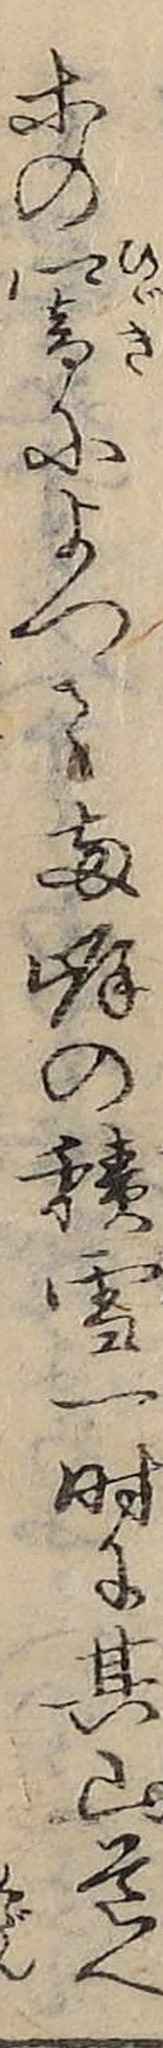等の響によつて両岸の積雪一時に其山道へ
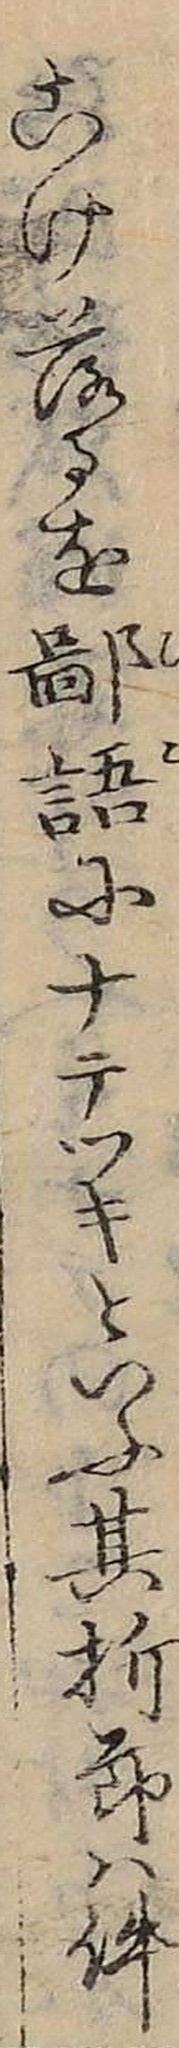こけ落るを鄙語にナテツキといふ其折節は件

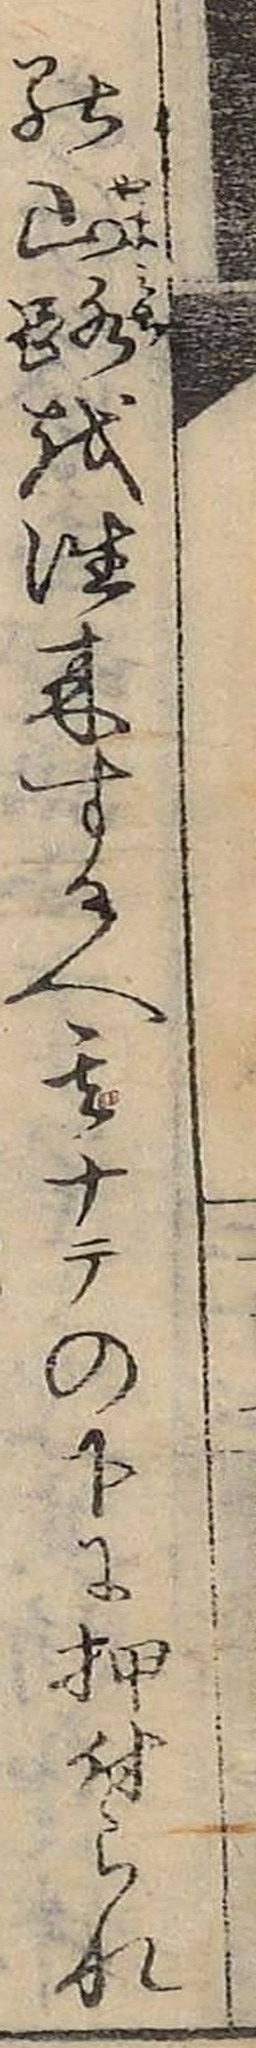の山路を往来する人其ナテの下に押付られ
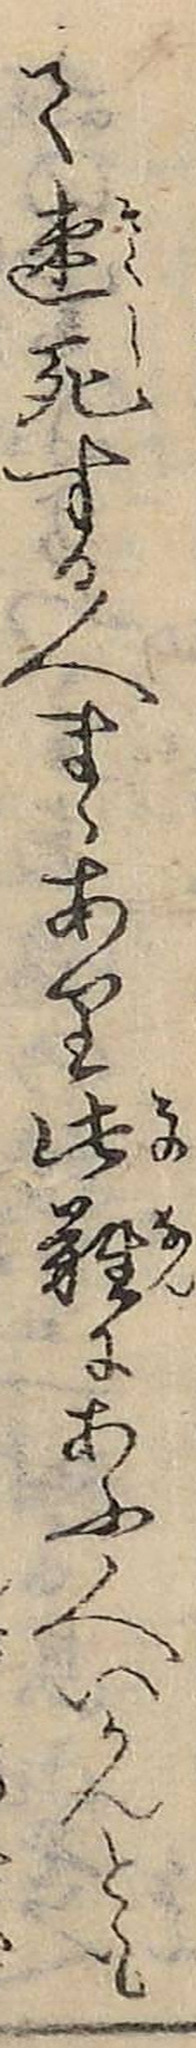て速死する人まゝあり此難にあふ人いかんとも
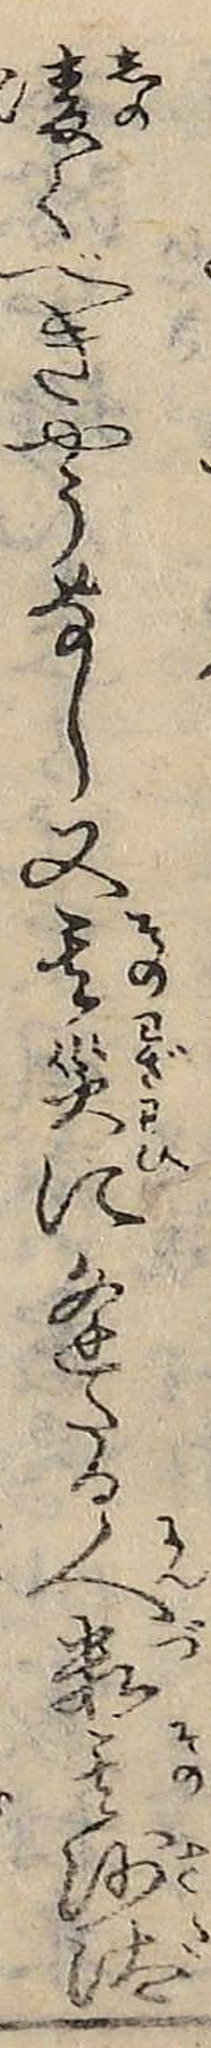凌くべきやうなし又其災に逢たる人数其沙汰
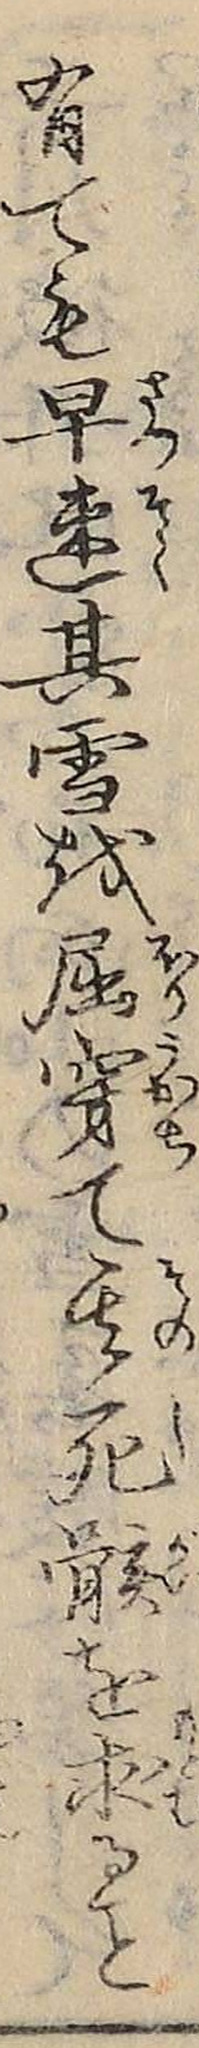有ても早速其雪を屈穿て其死骸を求ること
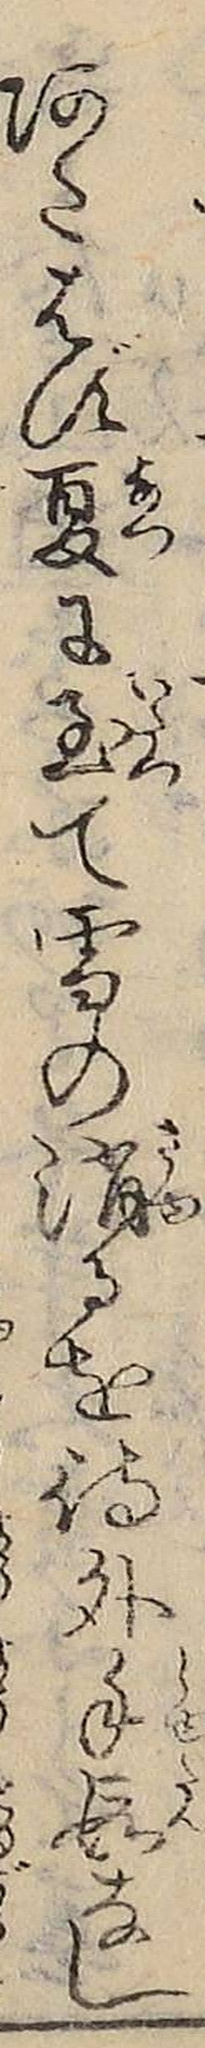あたはず夏に至て雪の消るを待外手段なし
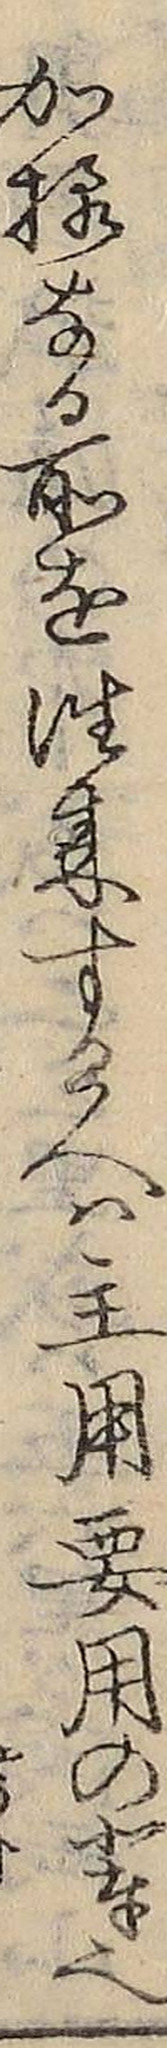か様なる所を往来する人は主用要用の輩也
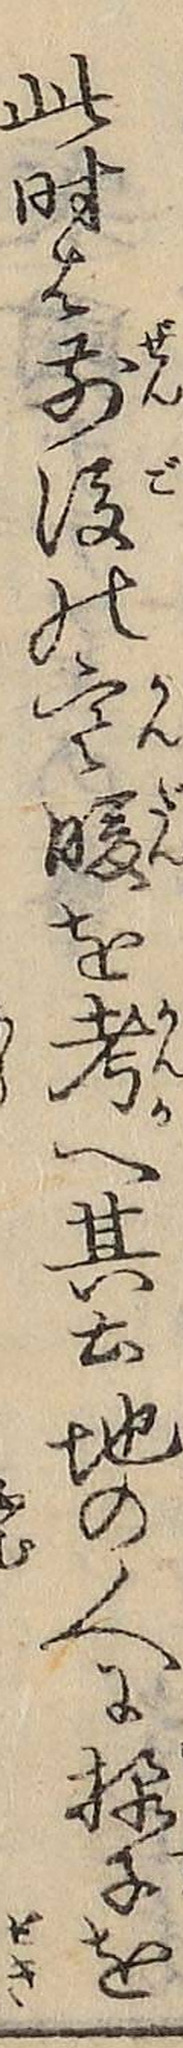此時は前後の寒暖を考へ其土地の人に様子を
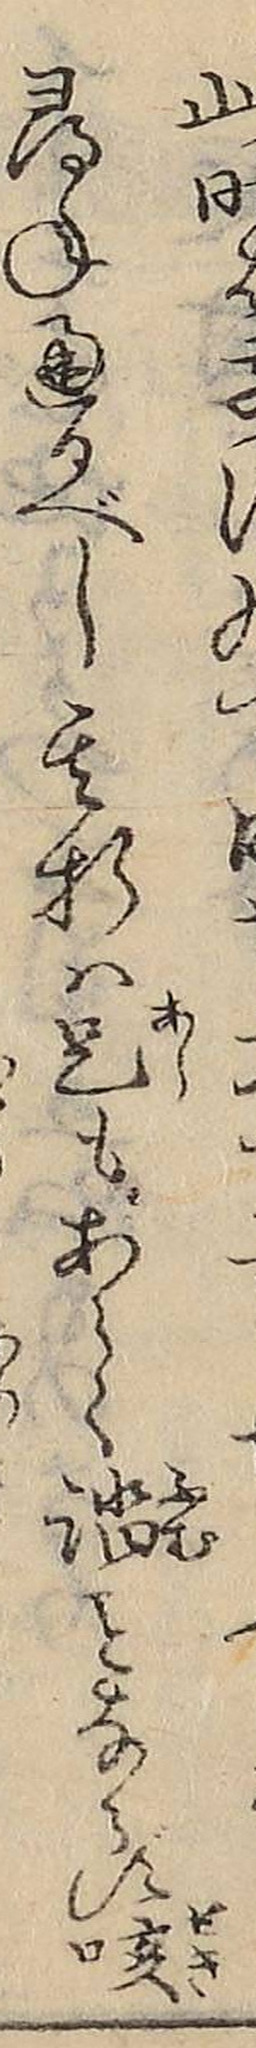尋ね通るべし其折は足もあらく踏ことならず咳
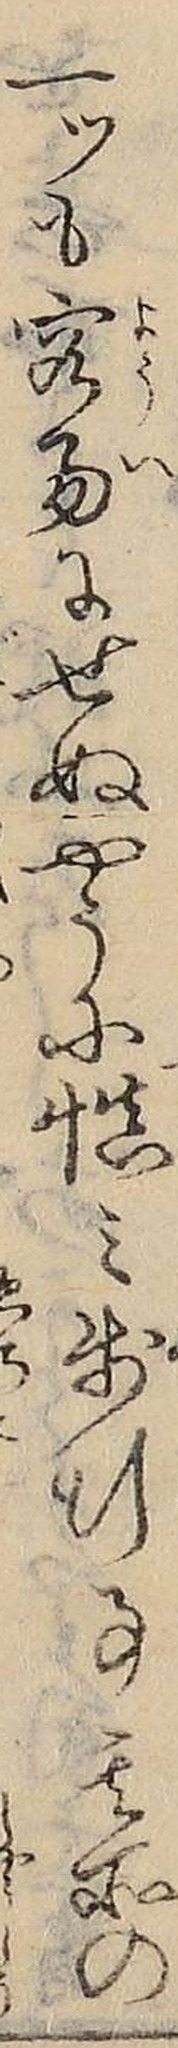一つも容易にせぬやうに慎み歩行事其所の
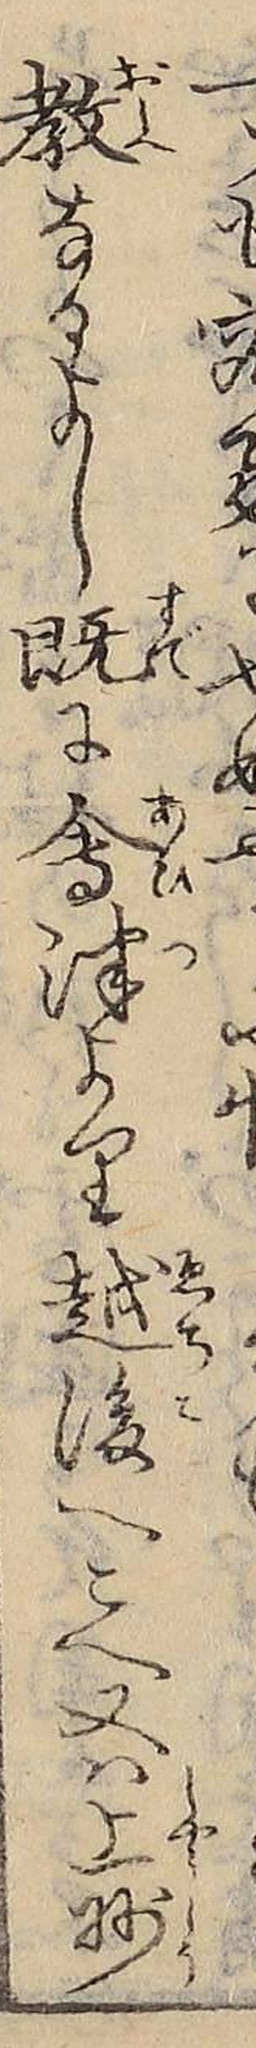教なるよし既に会津より越後へこへ又は上州
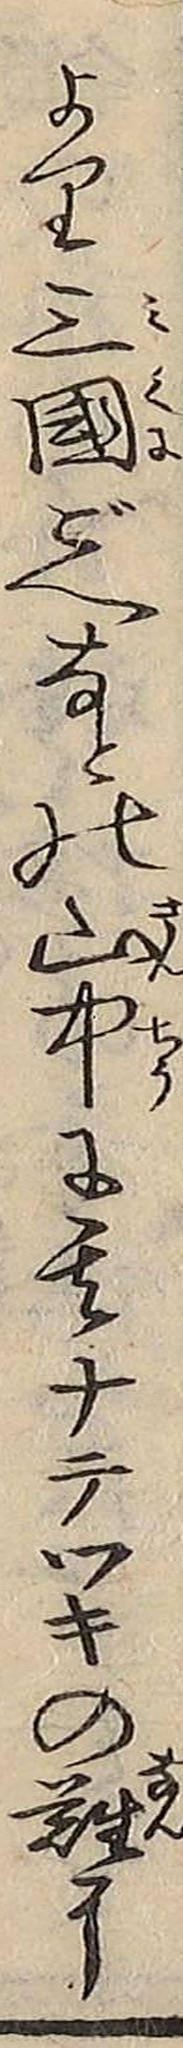より三国ごへなとの山中に其ナテツキの難に
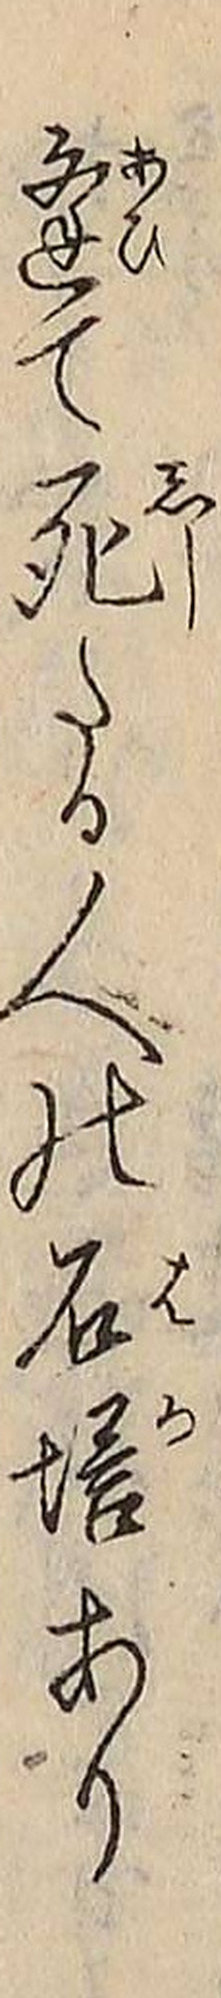逢て死たる人の石塔あり
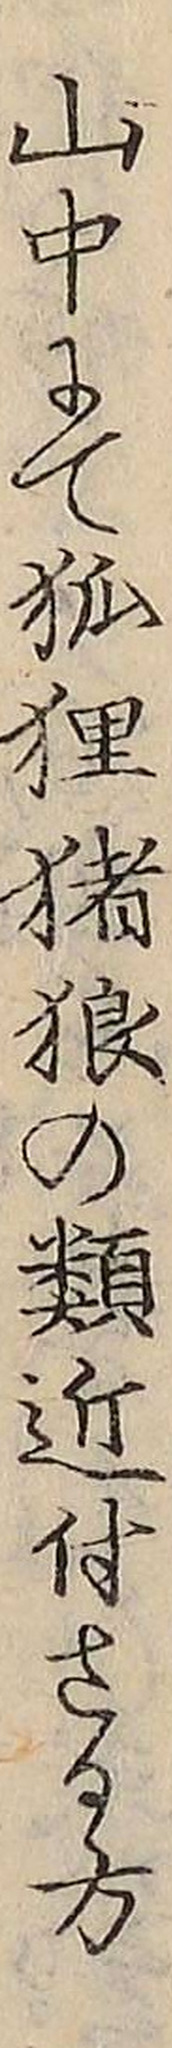山中にて狐狸猪狼の類近付さる方
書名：旅行用心集
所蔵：神戸大学附属図書館 国文学研究資料館
